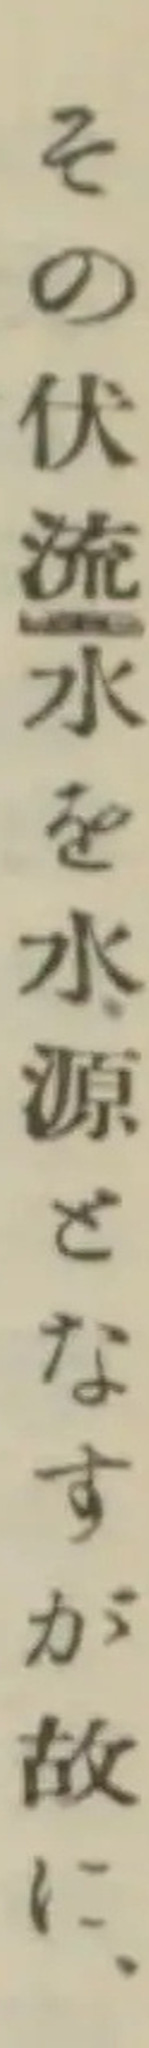その伏流水を水源となすが故に、
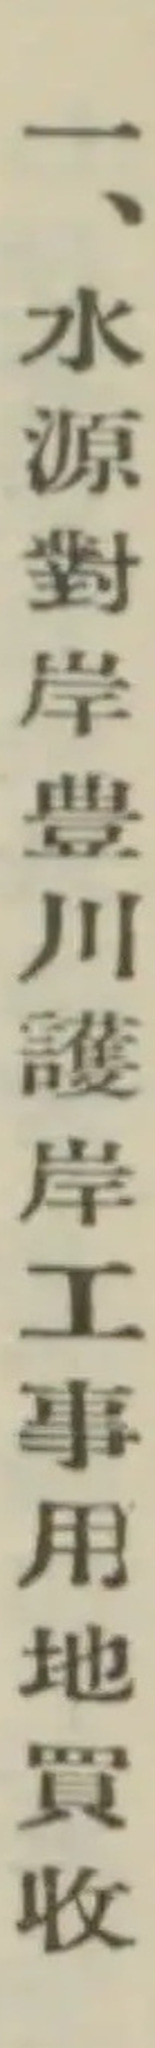一、水源対岸豊川護岸工事用地買収
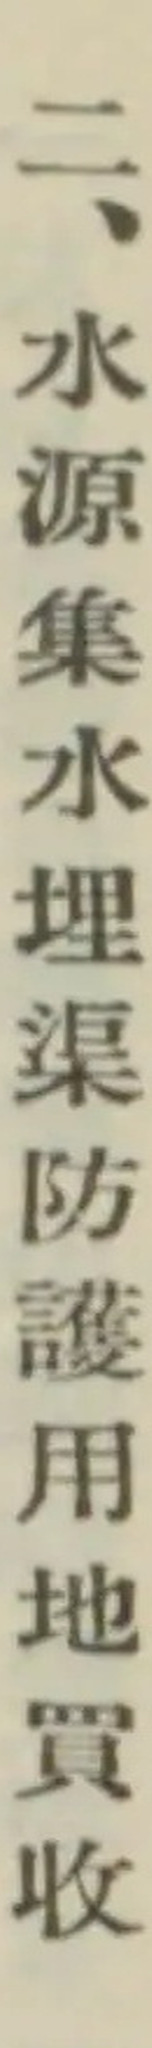二、水源集水埋渠防護用地買収
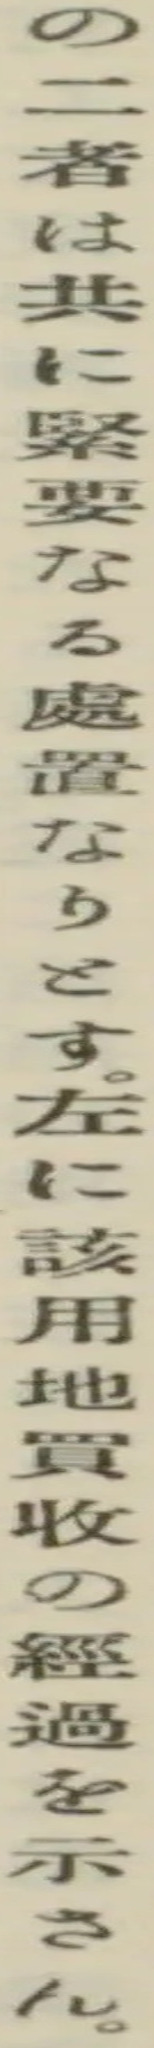の二者は共に緊要なる処置なりとす。左に該用地買収の経過を示さん。
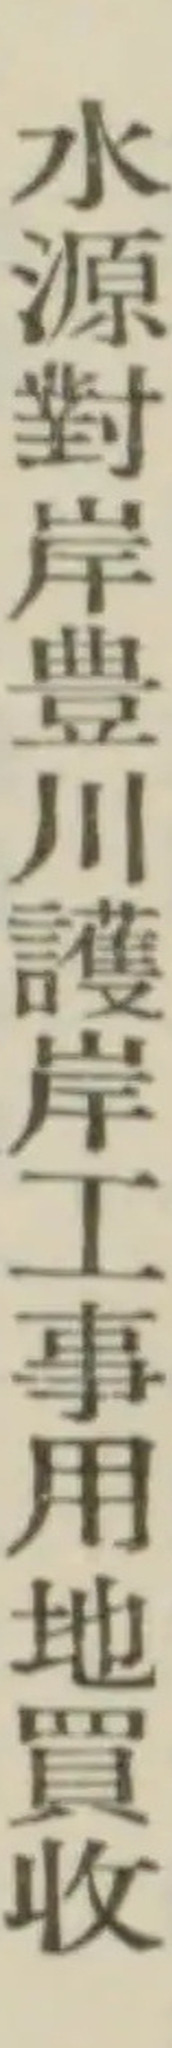水源対岸豊川護岸工事用地買収
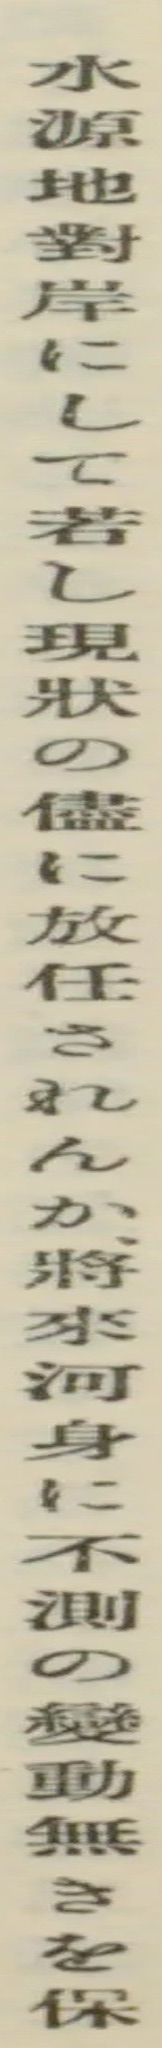水源地対岸にして若し現状の儘に放任されんか、将来河身に不測の変動無きを保
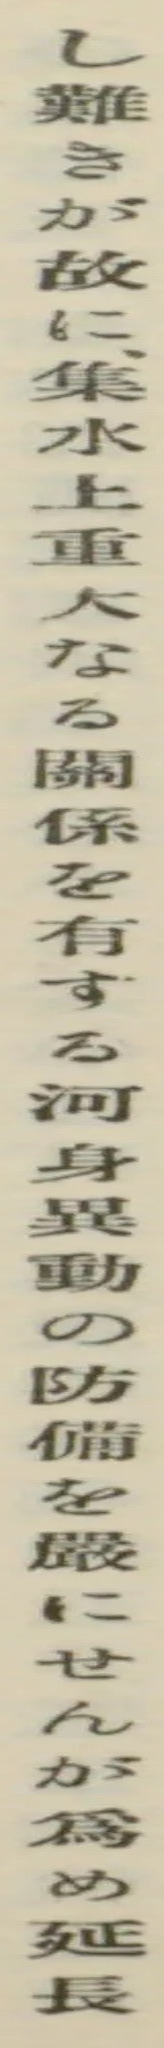し難きが故に、集水上重大なる関係を有する河身移動の防備を厳にせんが為め延長
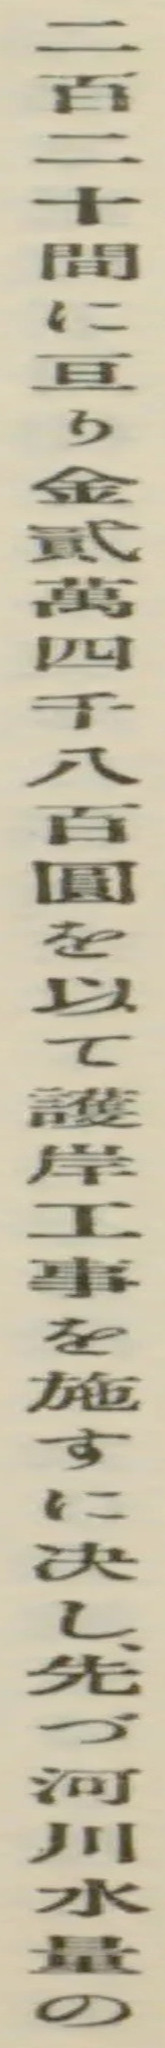二百二十間に亘り金貳萬四千八百圓を以て護岸工事を施すに決し、先ず河川水量の
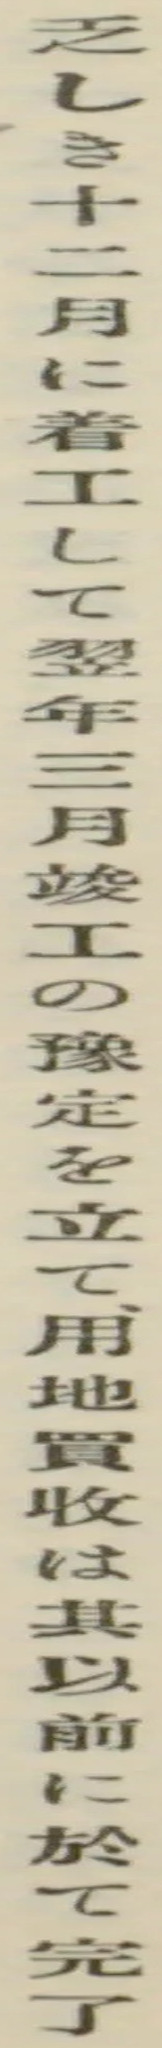乏しき十二月に着工して翌年三月竣の予定を立て、用地買収は其以前に於て完了
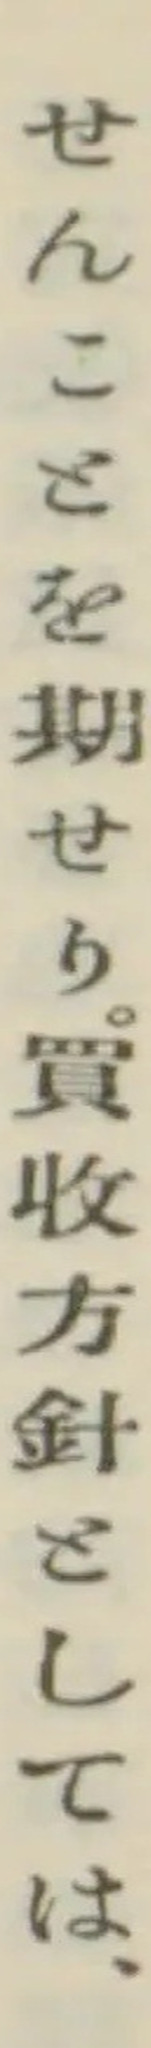せんことを期せり。買収方針としては、
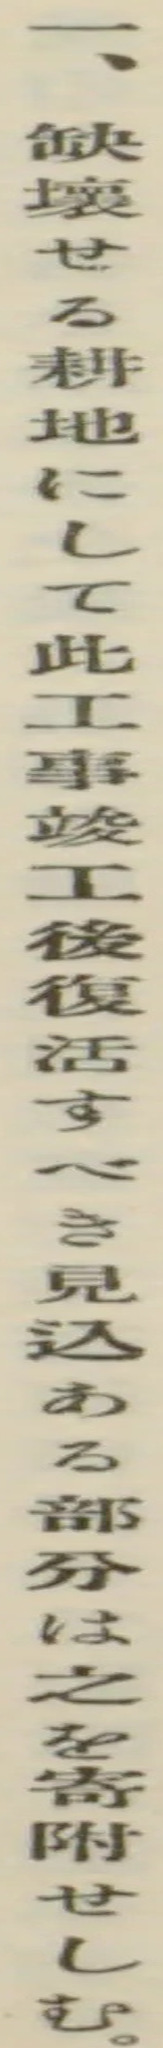一、缺壊せる耕地にして此工事竣工後復活すべき見込みある部分は之を寄付せしむ。
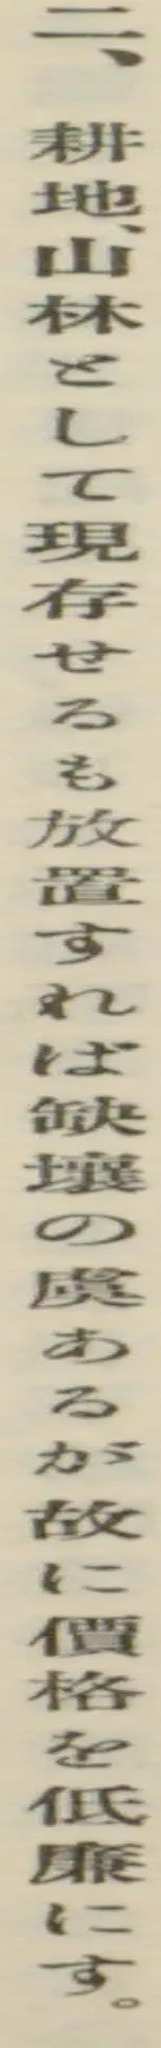二、耕地、山林として現存せるも放置すれば缺壊の虞あるが故に価格を低廉にす。
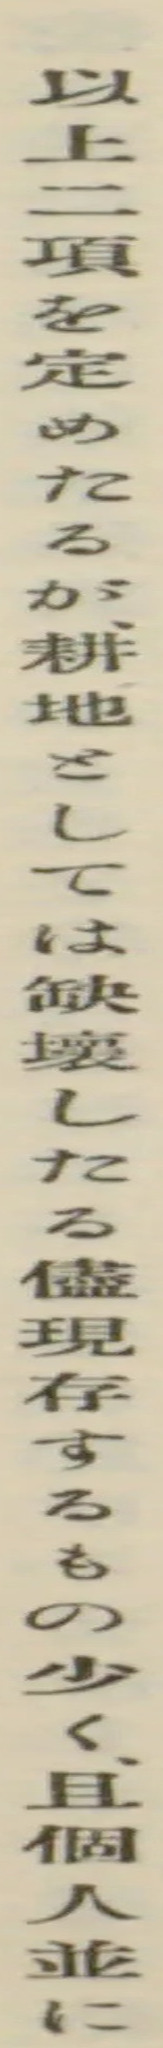以上二項を定めたるが、耕地としては缺壊したる儘現存するもの少く、且個人並に
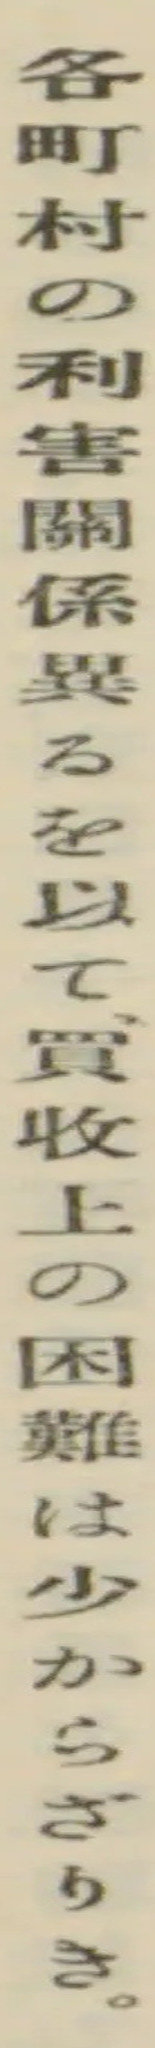各町村の利害関係異るを以て、買収上の困難は少からざりき。

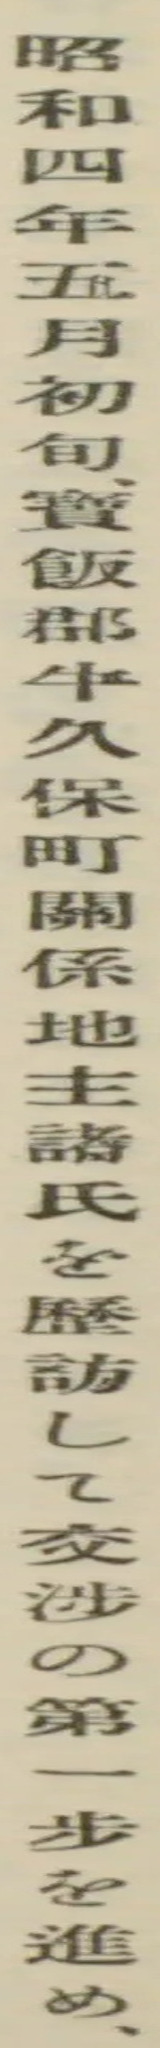昭和四年五月初旬、寶飯郡牛久保町関係地主諸氏を歴訪して交渉の第一歩を進め、
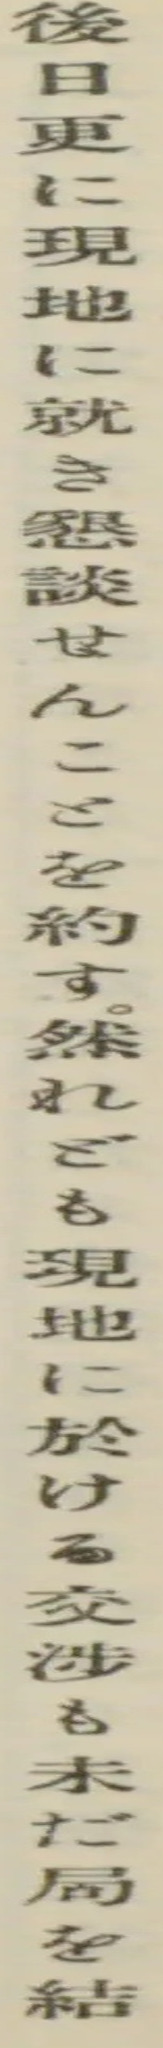後日更に現地に就き懇談せんことを約す。然れども現地に於ける交渉も未だ局を結
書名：豊橋市水道誌
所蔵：国立国会図書館 National Diet Library, JAPAN
